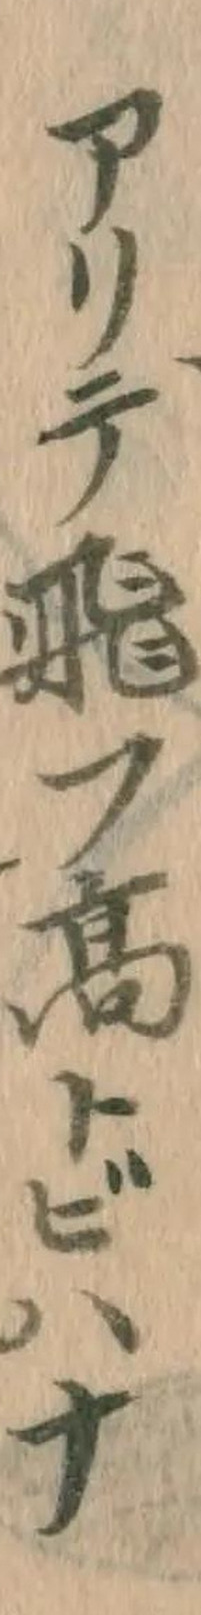アリテ飛フ髙トビハナ
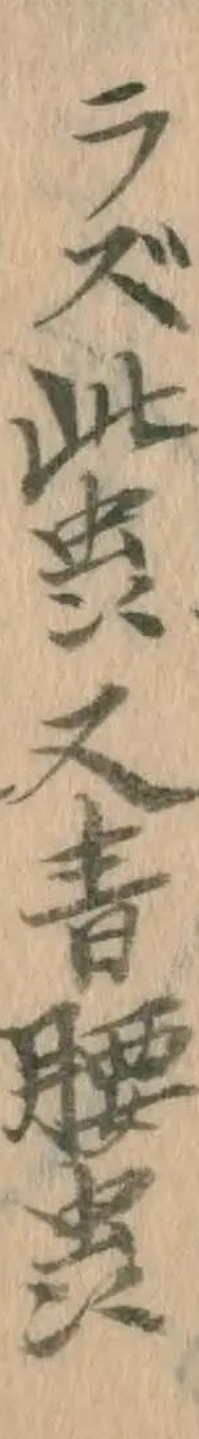ラズ此蟲又青腰蟲
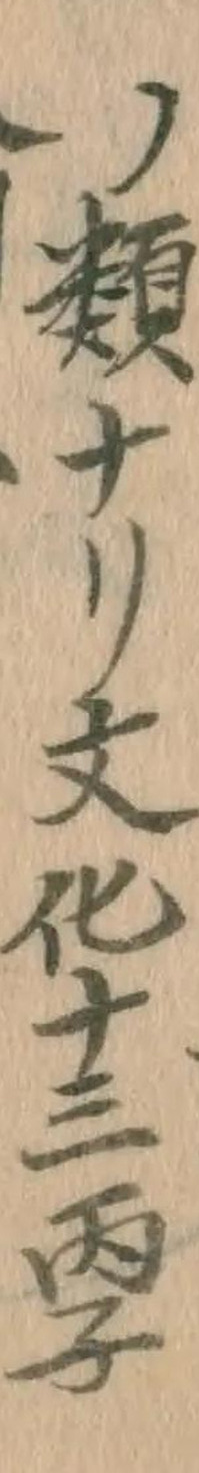ノ類ナリ文化十三丙子
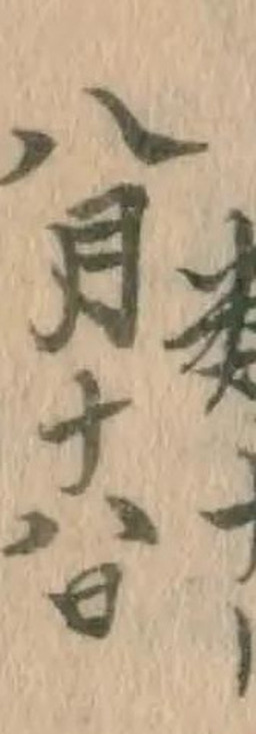八月十八日
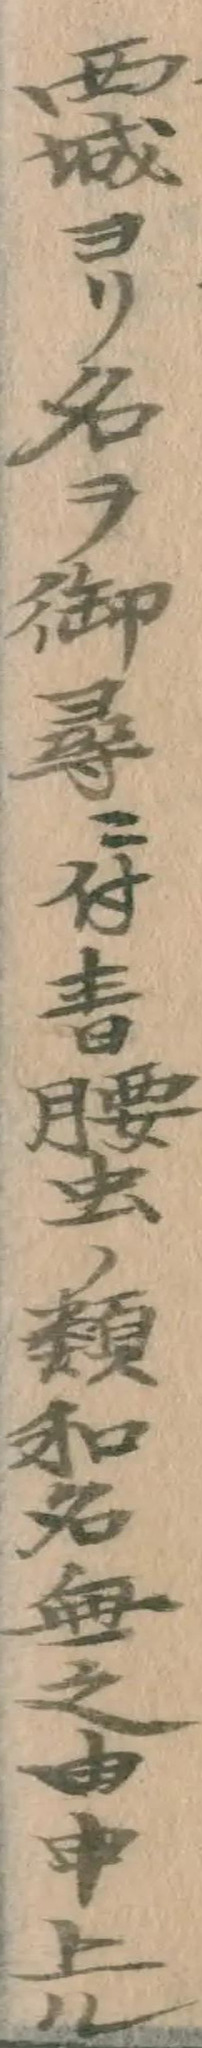西城ヨリ名ヲ御尋ニ付青腰虫ノ類和名無之由申上ル
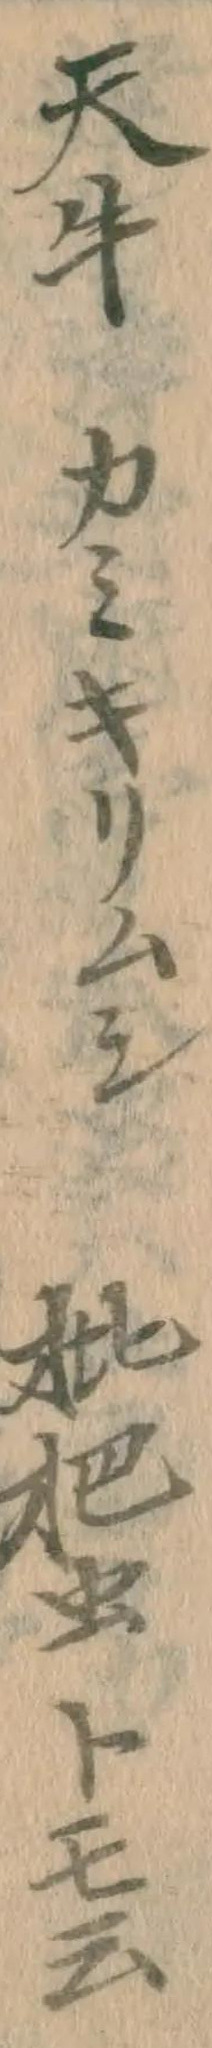天牛カミキリムシ枇杷虫トモ云
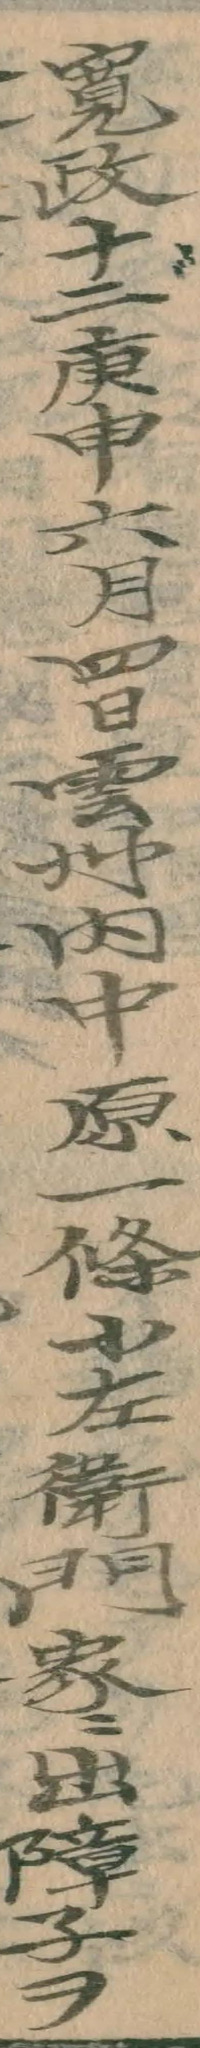寛政十二庚申六月四日雲州内中原一條小左衛門家ニ出障子ヲ
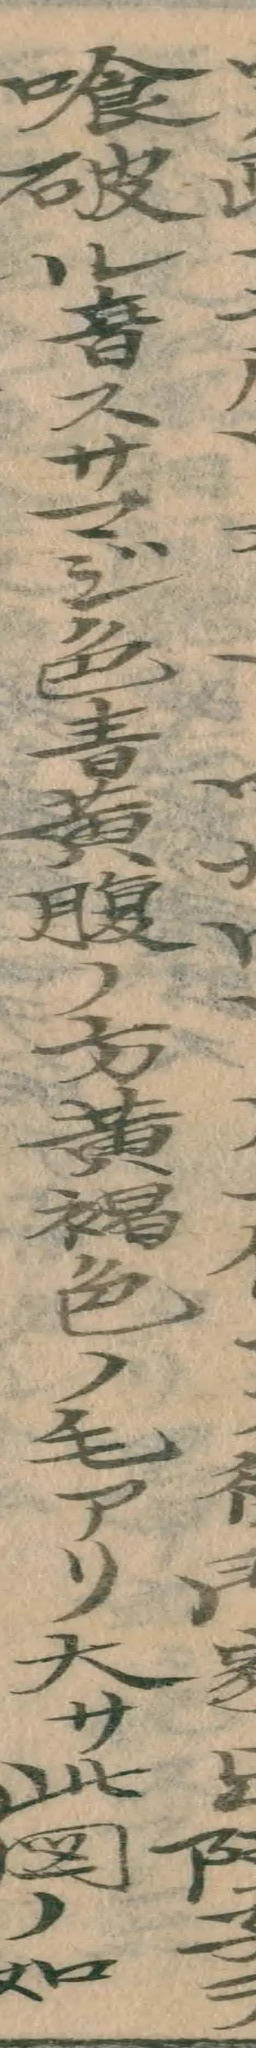喰破ル音スサマジ色青黄腹ノ方黄褐色ノ毛アリ大サ此図ノ如
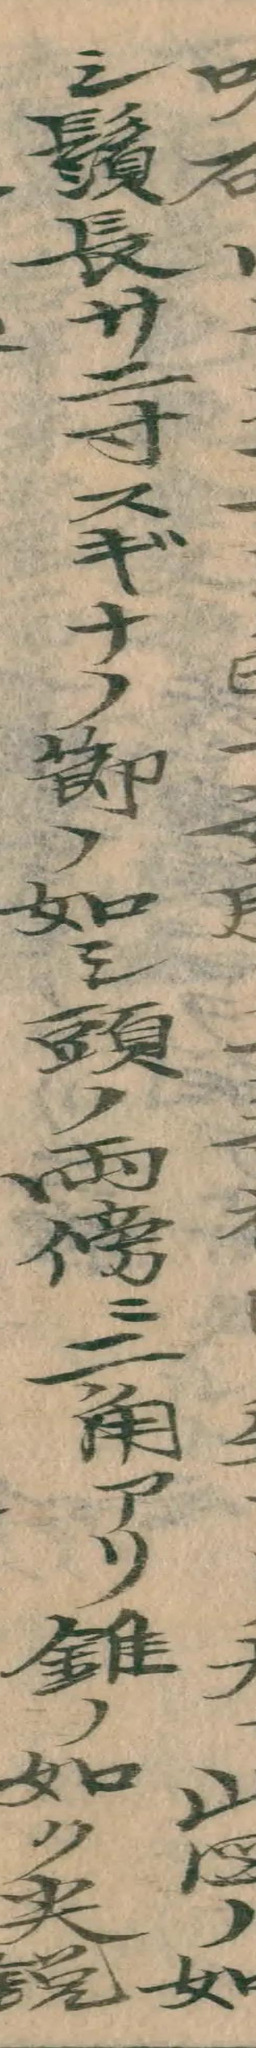シ鬚長サ二寸スギナノ節ノ如シ頭ノ両傍ニ角アリ錐ノ如ク尖鋭
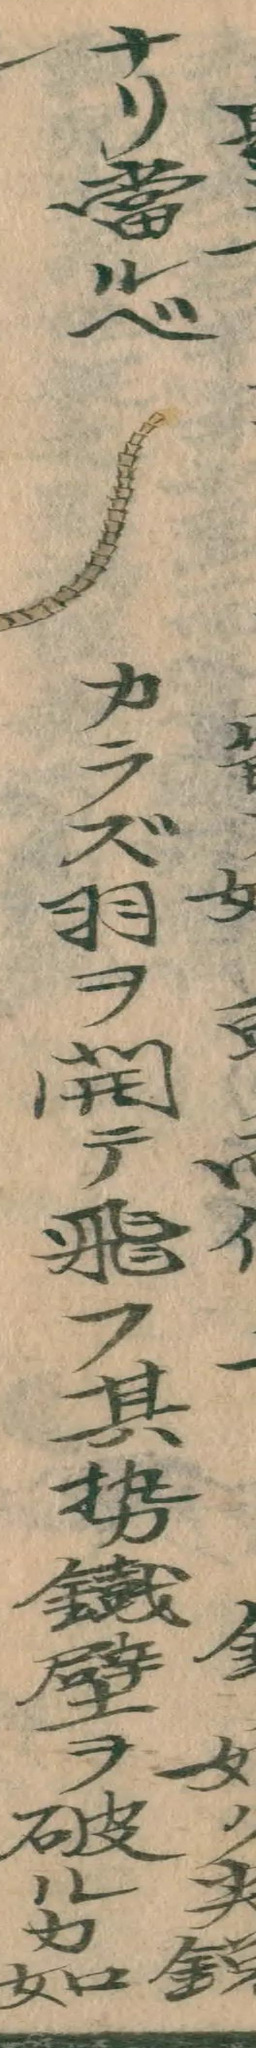ナリ當ルベカラズ羽ヲ開テ飛フ其勢鐡壁ヲ破ルカ如
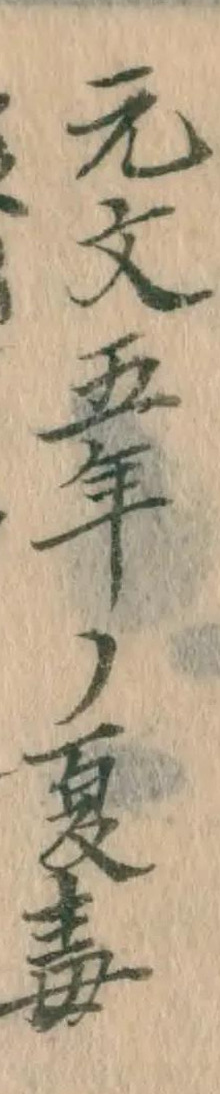元文五年ノ夏毒
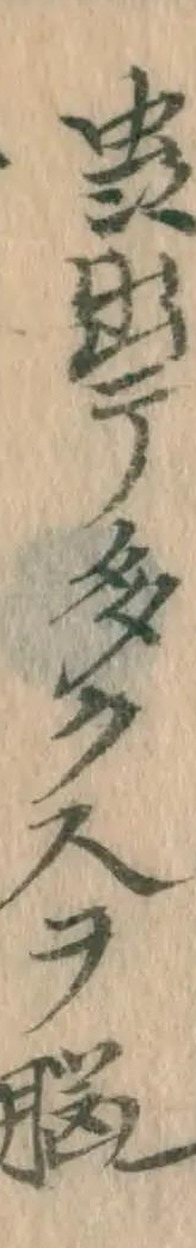蟲出テ多ク人ヲ脳
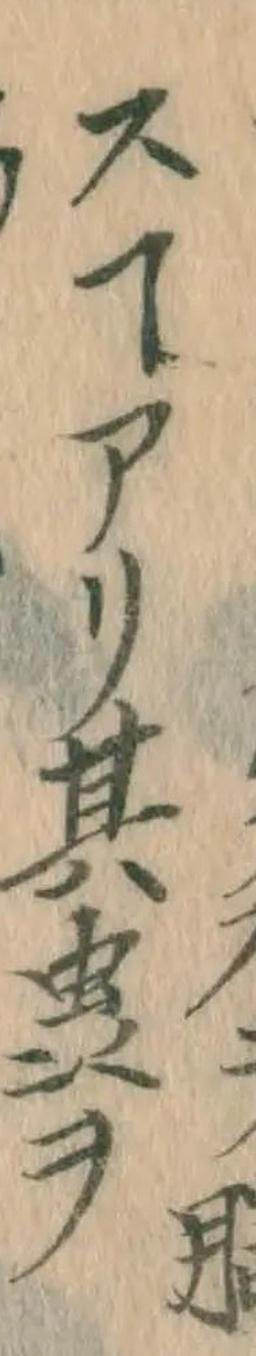スコトアリ其蟲ヲ
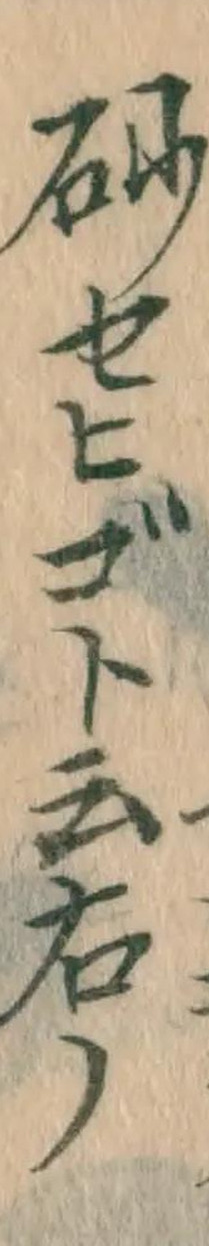砂セヒゴト云右ノ
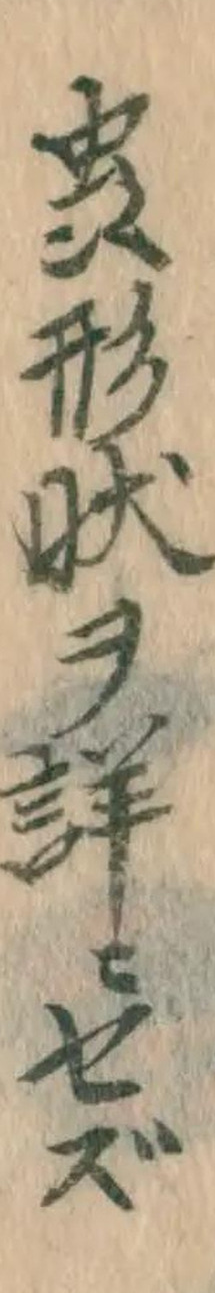蟲形状ヲ詳ニセズ
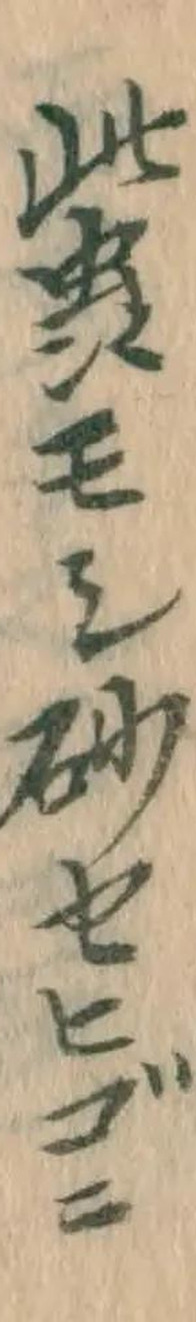此蟲モシ砂セヒゴニ
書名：千蟲譜 3巻. [2]
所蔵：国立国会図書館 National Diet Library, JAPAN
